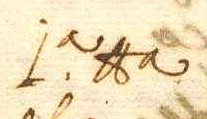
1.a tta
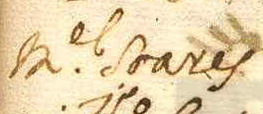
M.el soares
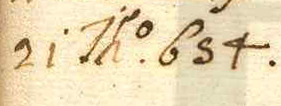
21 Jh.o 654.
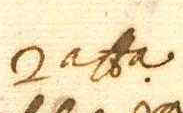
2a tt.a
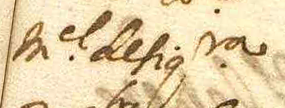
M.el de Siq.ra
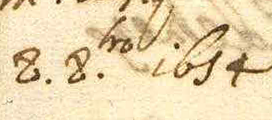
8. 8.bro i654
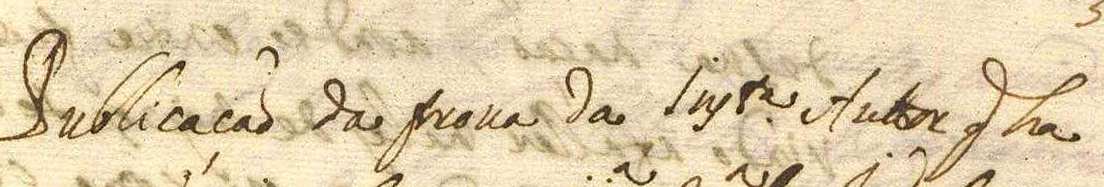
Publicaçaõ da proua da Iust.a Auttor q̄ ha
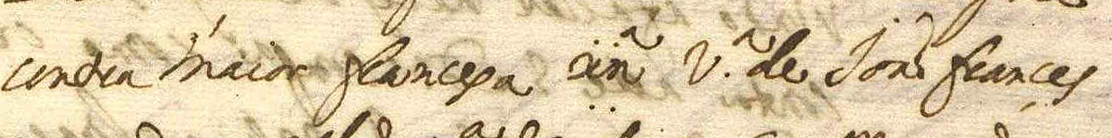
contra maior francesa x na V.a de Ioaõ frances
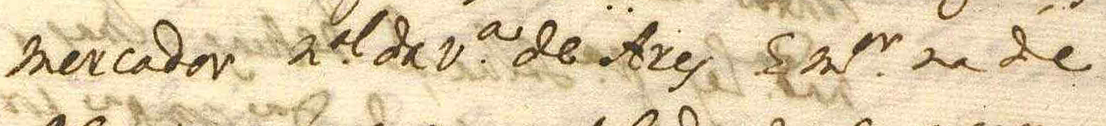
mercador n.al da v.a de Ares E mor. na de
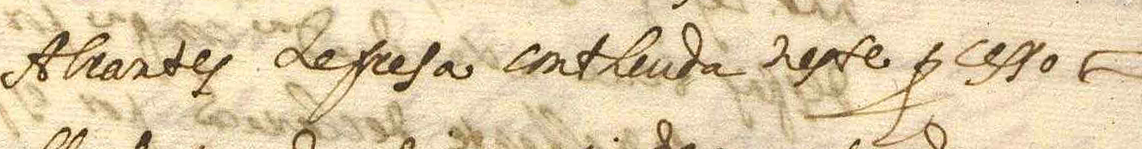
Abrantes re presa contheuda neste ꝓcesso
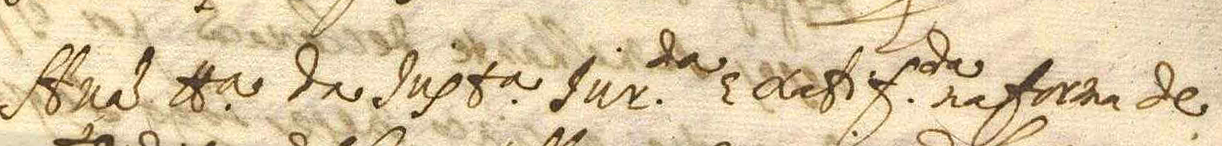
Huā tt.a da Iust.a Iur.da E ratif.da na forma de
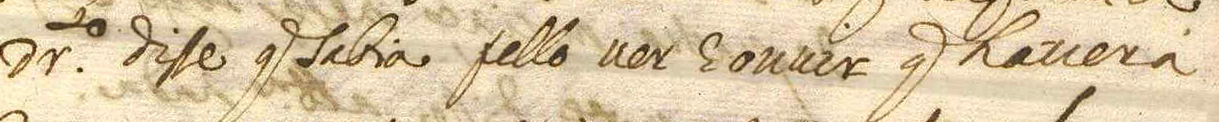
dr.to disse q̄ sabia pello uer E ouuir q̄ hauerá
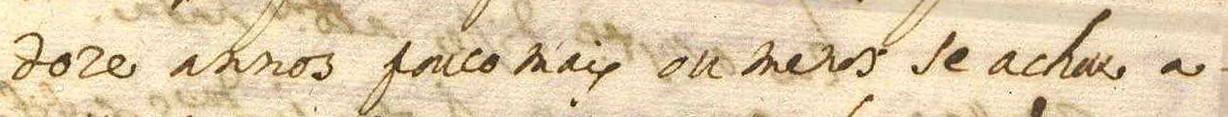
doze annos pouco mais ou menos se achou a
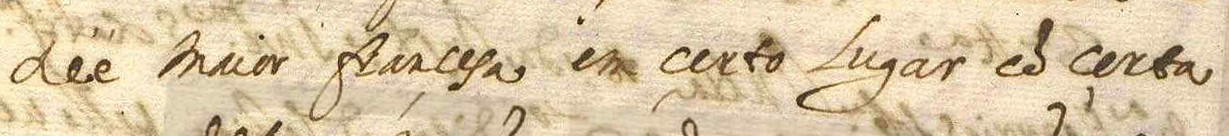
ree maior francesa em certo lugar cō certa
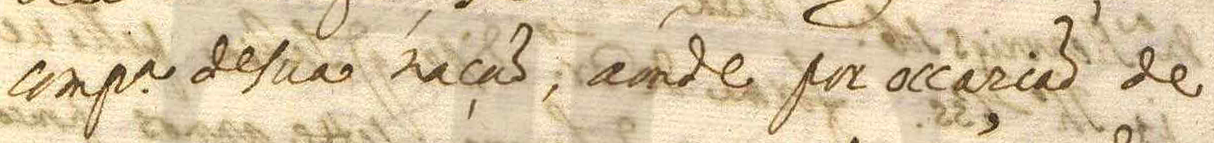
comp.a de sua naçaõ, aonde por occaziaõ de
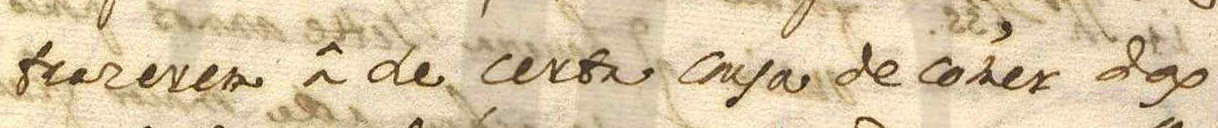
trazerem â re certa casa de comer das
